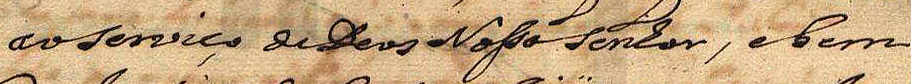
ao serviço de Deos Nosso senhor, e bem
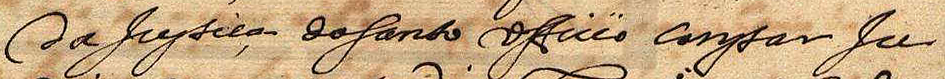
da Justiça do santo officio constar Ju
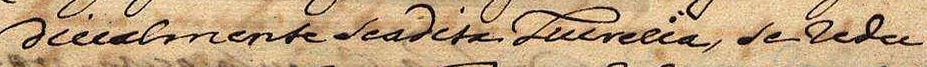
dicialmente se a dita Lucrecia, se Redu
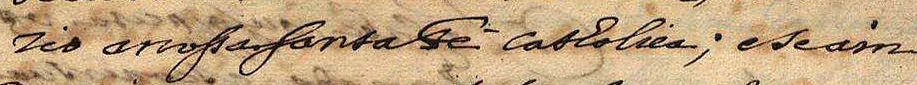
zio a nossa santa Fé catholica; e se ain
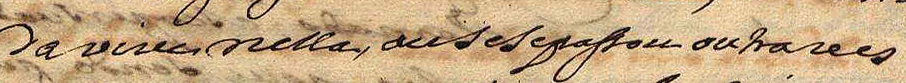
da vive nella, ou se se passou outra ves
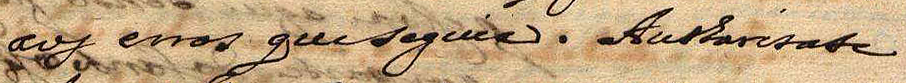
aos erros que seguia. Authoritate
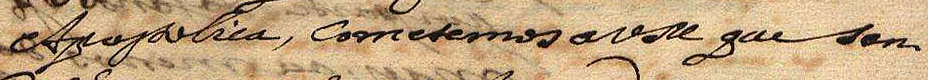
Apostolica, cometemos a VM que sen
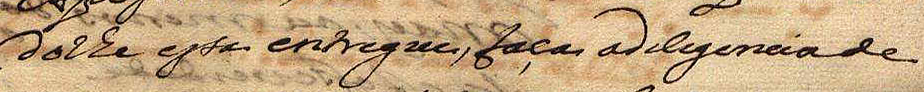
dolhe esta entregue, faça a diligencia de
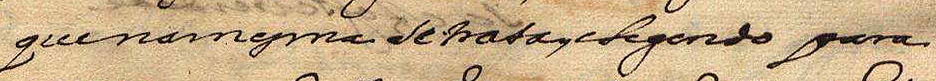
que na mesma se trata, elegendo para
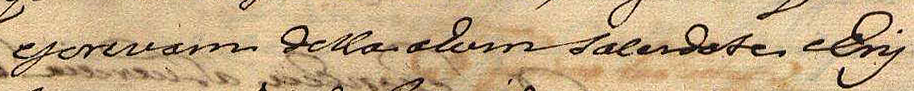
escrivam della a hum sacerdote e chris
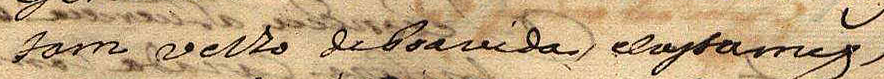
tam velho de boa vida, e custumes,
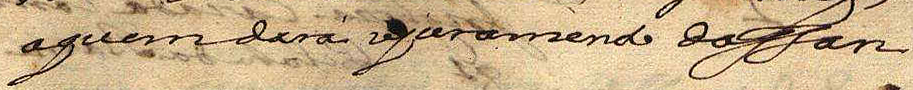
a quem dará o juramento dos san
